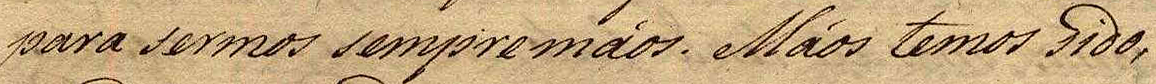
para sermos sempre máos. Máos temos sido,
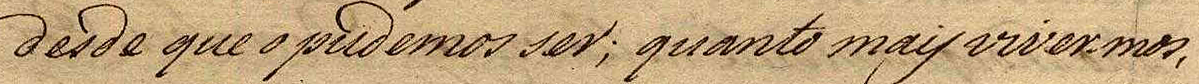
desde que o pudemos ser; quanto mais vivermos,
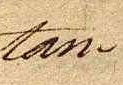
tan
